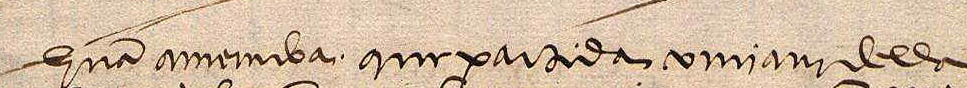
huā amemdoa que partida comiam della
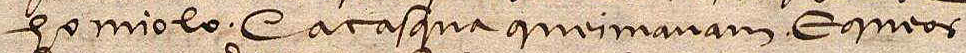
ho miolo. e a casqua queimauam E que os
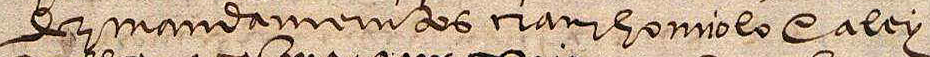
dez mandamemtos eram ho miolo e a ley
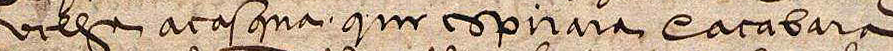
velha a casqua que espirara e acabara
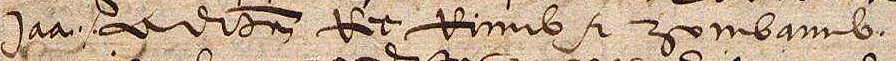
Jaa ./. a dita Ree Rimdo e zombamdo
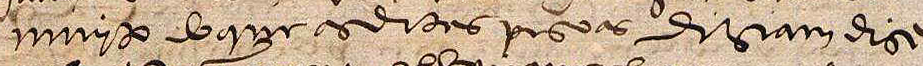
muyto do que as ditas pesoas diziam dise
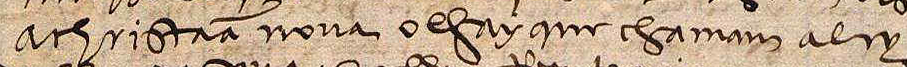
a christaā noua olhay que chamam a ley
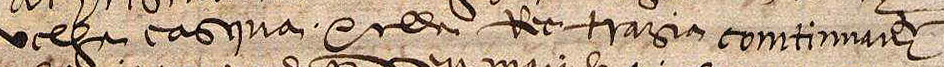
velha casqua. e ella Ree trazia comtinuamte
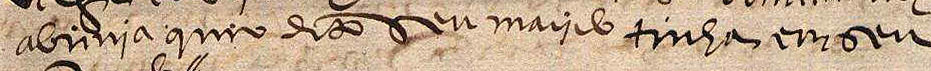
a briuja que o dito seu marjdo tinha em seu
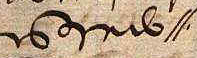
estrado //.
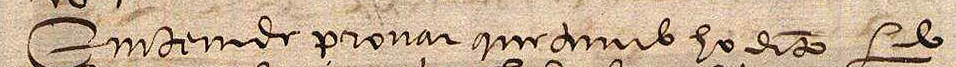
Emtemde prouar que temdo ho dito Ldo
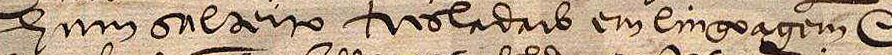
hum salteiro tresladado em lingoagem e
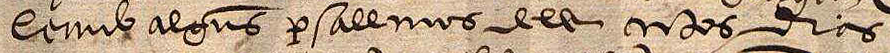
lemdo algūs psallmos delle certos dias
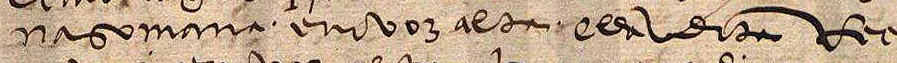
na somana. em voz alta ella dita Ree
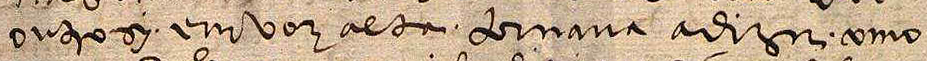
outrosy em voz alta tornaua a dizer. como
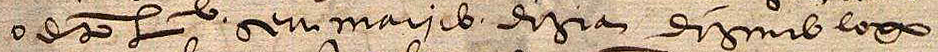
o dto Ldo seu marjdo dizia dizendo logo
